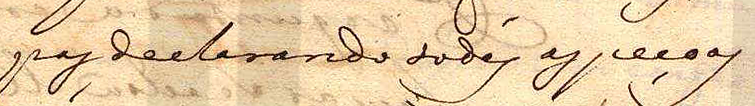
pas, declarando todas as peçoas
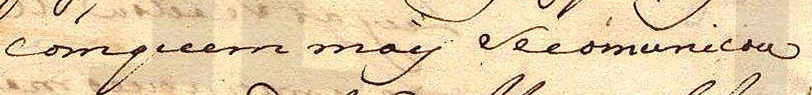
com quem mais se comunicou
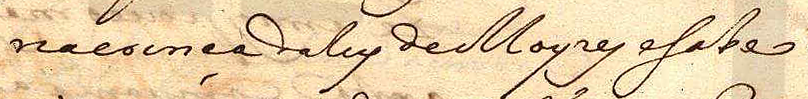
na crença da ley de Moyzes e sabe
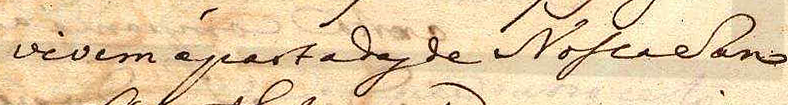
vivem apartadas de Nossa San
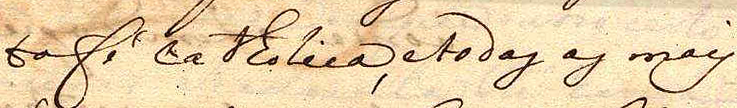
ta fé catholica, e todas as mais
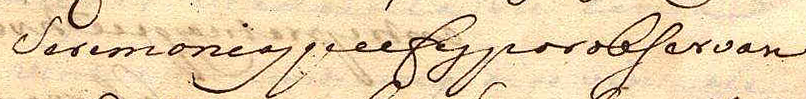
Seremonias que fes por observan
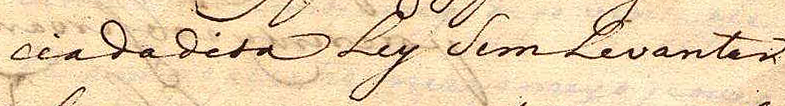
cia da dita Ley sem Levantar
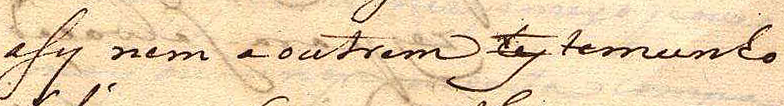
asy nem a outrem testemunho
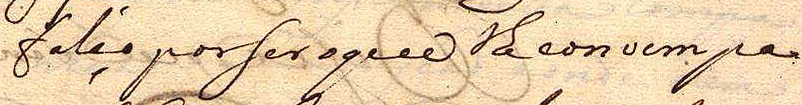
falço por ser o que lhe convem pa
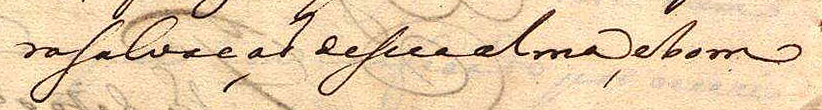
ra salvaçaõ de sua alma, e bom
